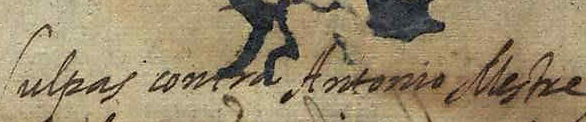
Culpas contra Antonio Mestre
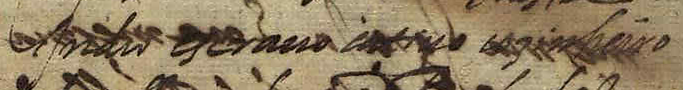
Jndio escrauo catiuo cozinheiro
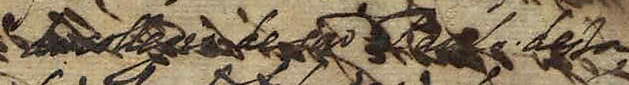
do collegio de são Paulo desta
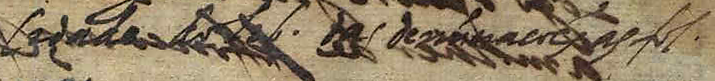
Cidade do lib. das denūciaçoẽs as fol.
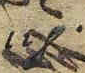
118.
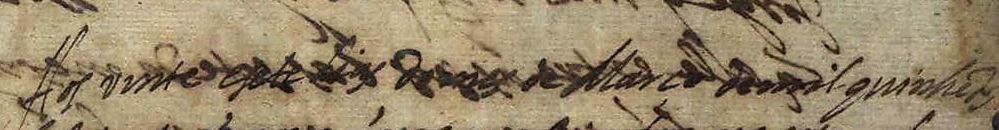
Aos vinte e sete dias do mes de Março de mil quinhētos
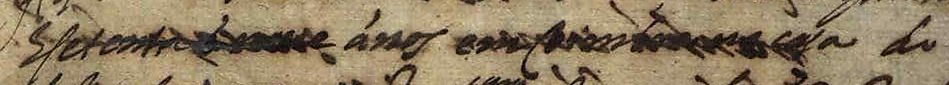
E setenta e noue ānos em Coimbra na casa do
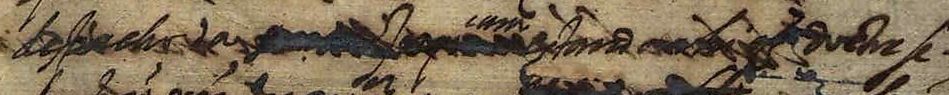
despacho da santa Jnq.çam estando ahi o s̄ doctor se
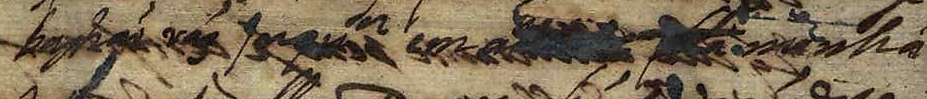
bastiaõ vaz̄ Jnquor em aud de pella manhā
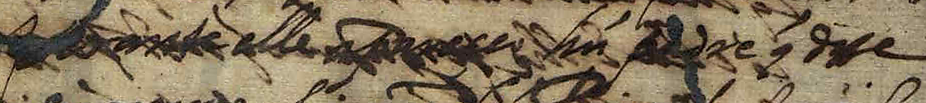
perante elle apareceo hū padre q̄ disse
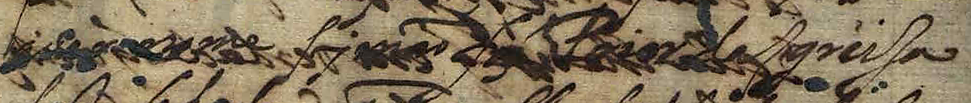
auer nome symão frz̄ Prior da JgreiJa
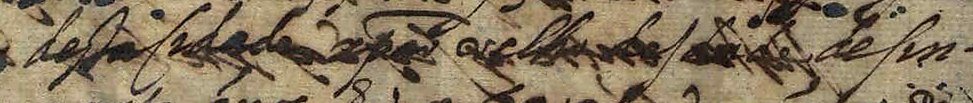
desta Cidade xpão velho de Jdade de sin
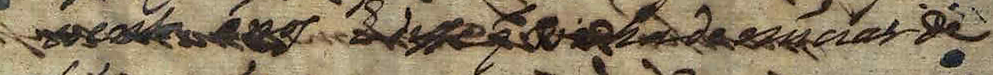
coenta ānos E disse q̄ vinha denūciar de
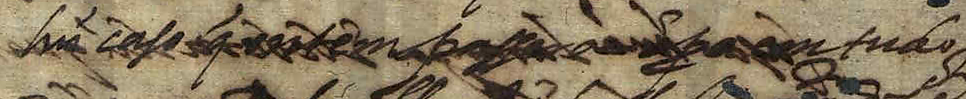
hū caso q̄ ontem passara E ꝑa em tudo
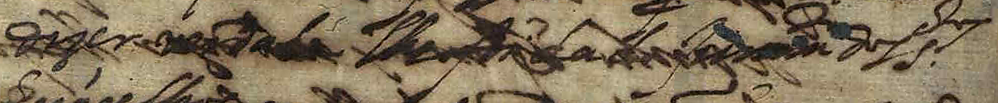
dizer verdade lhe foi dado Juramto dos s.ctos
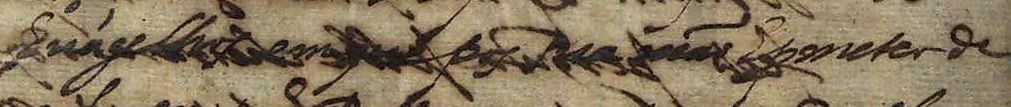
Euāgelhos em que pos sua maõ E ꝓmeteo de
